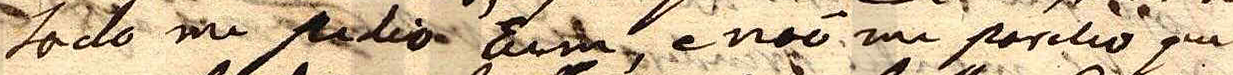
Lado me pedio huma, e naõ me pareceo que
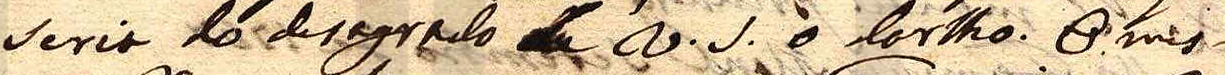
seria do desagrado de V. s. o darlho. O mes
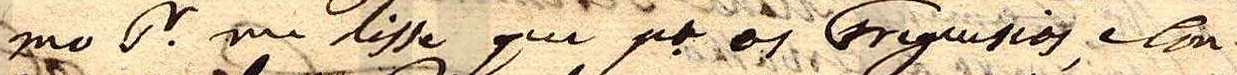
mo s.r me disse que pa as Freguesias, e Con
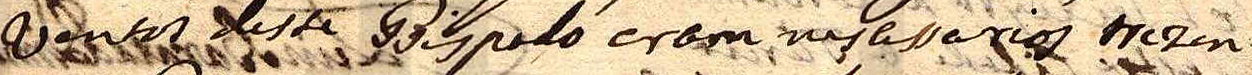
ventos deste Bispado eram nescessarios trezen
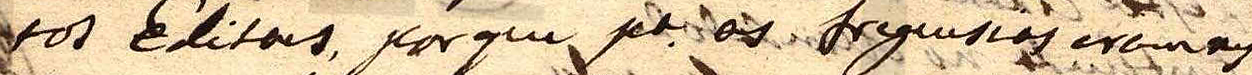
tos Editaes, porque pa. as freguesias eram nes
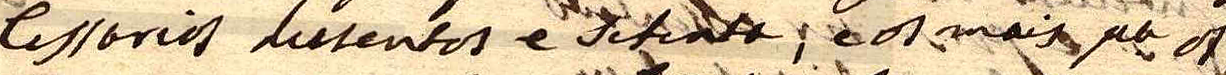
Cessarios dusentos e setenta; e os mais p.a os
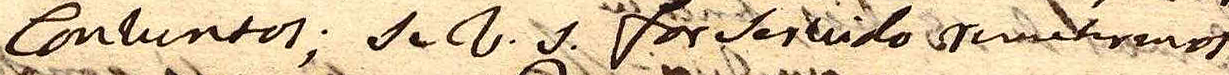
Conventos; se V. s. for seruido remetermos
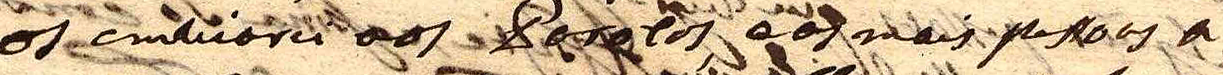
os emviarei aos Parocos, e as mais pessoas a
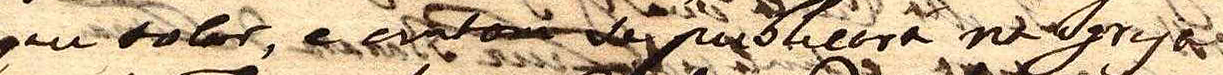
que tocar, e emtam se publicará na Igreja
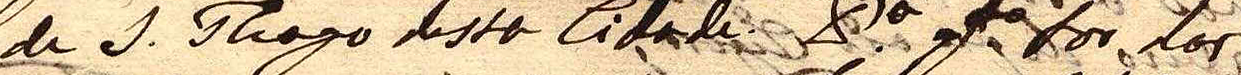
de S. Thiago desta Cidade. P.a q.to for dar
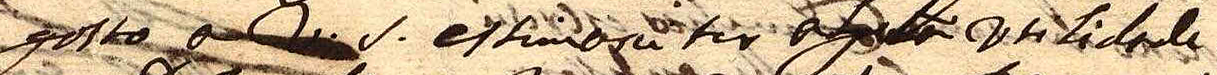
gosto a V. s. estimarei ter alguā vtilidade.
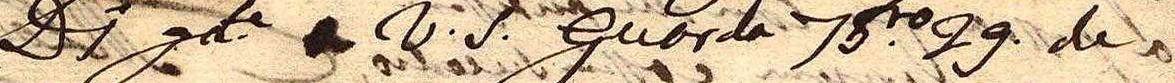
Ds̄ gd.e a V.s. Guarda 7bro. 29. de
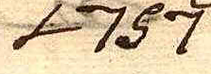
1757.
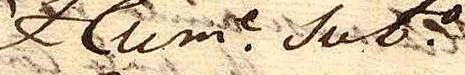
Hum.e sub̄.o
